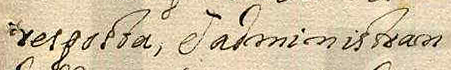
resposta, e administran
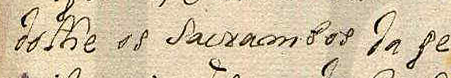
dolhe os Sacramtos da pe
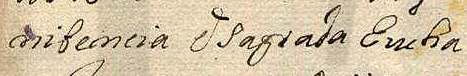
nitencia e Sagrada Eucha
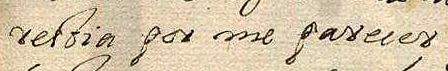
restia por me parecer
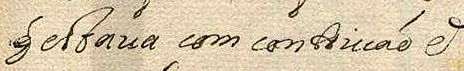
q̄ estaua com contricçaõ e
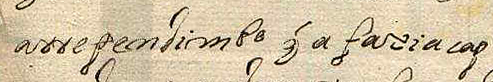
arrependimto q̄ a fazia cap
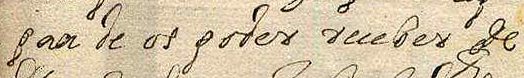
paz de os poder receber gde
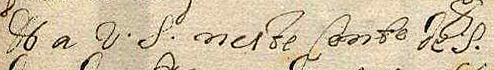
Ds a V. S. neste Conto de S.
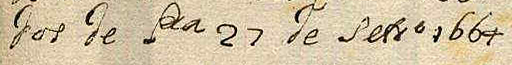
dos de Lxa 27 de setro 1664
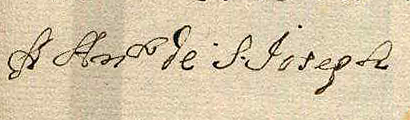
fr. Anto de S. Ioseph
